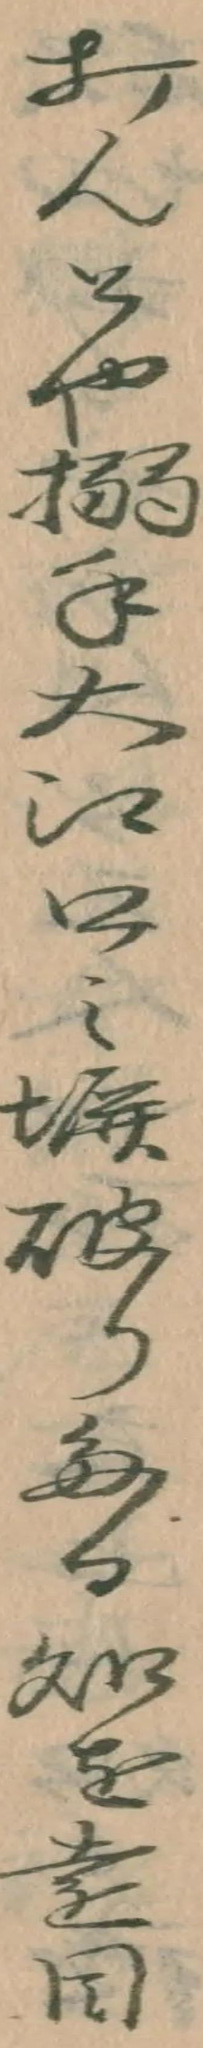打んとや搦手大江口之塀破り多る処を遠目
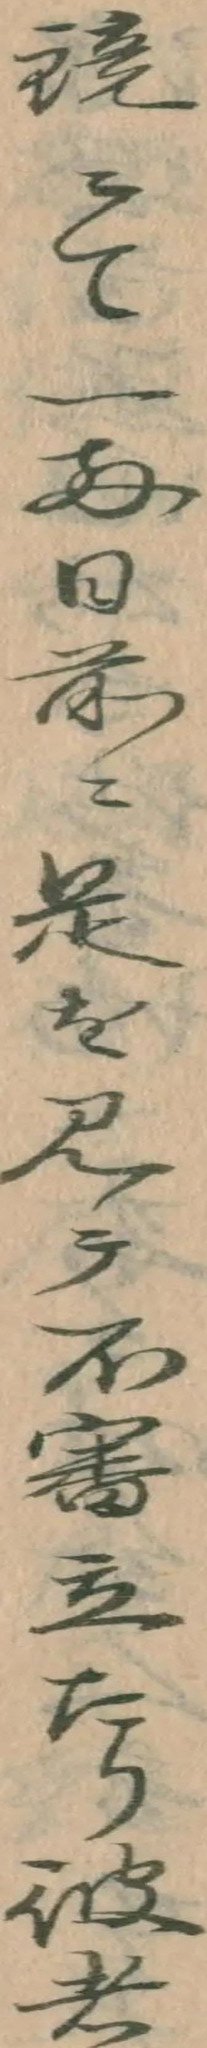鏡にて一両日前に是を見て不審立たり彼者
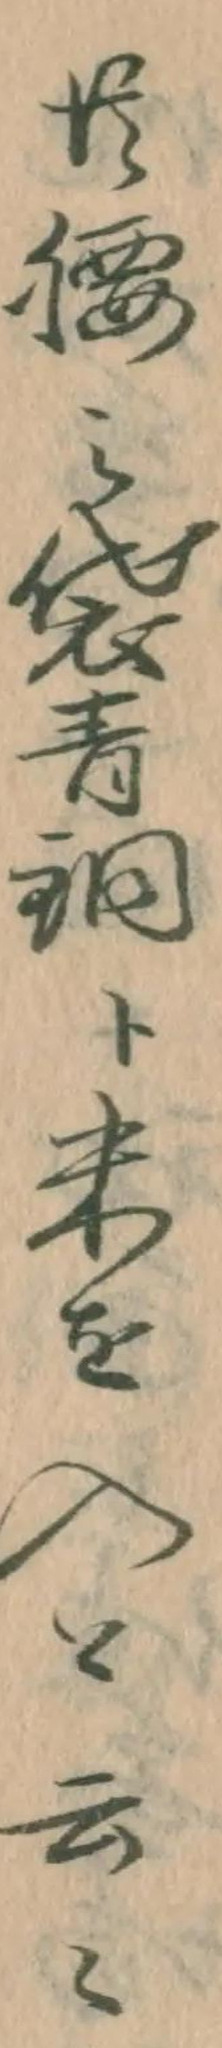共腰之袋青銅と米を入と云々
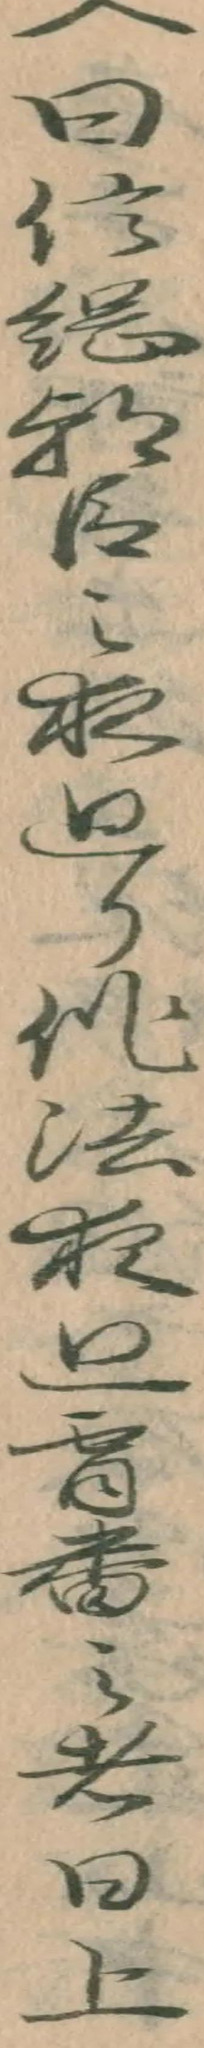又曰信綱朝臣之夜回り作法夜廻宵番之者日上
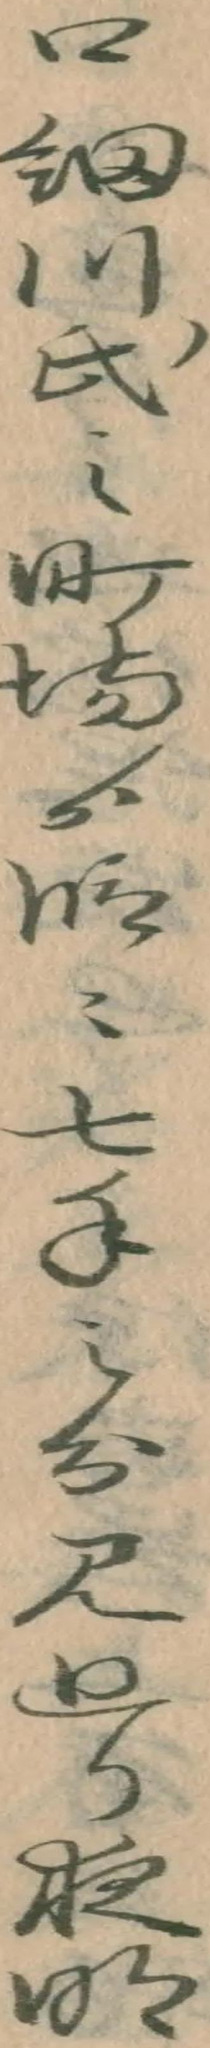口細川氏之町場ゟ段々七手之分見廻り夜明
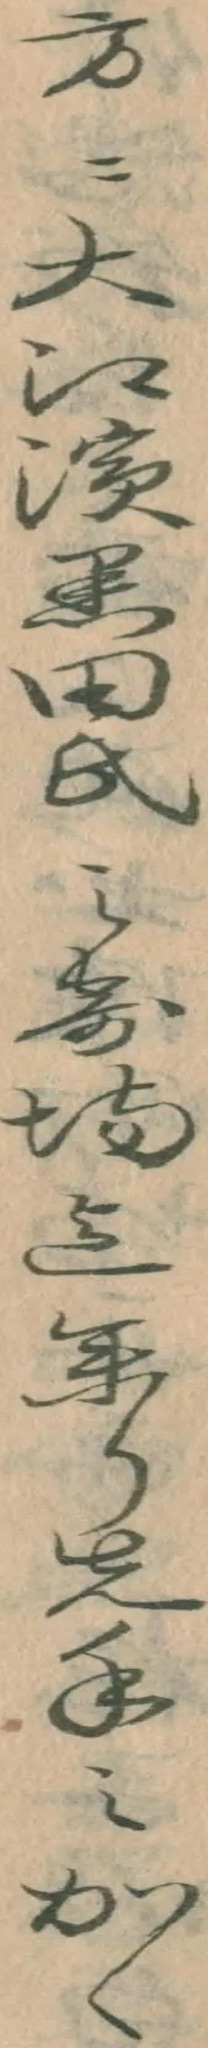方に大江浜黒田氏之寄場迄参り先手之加く
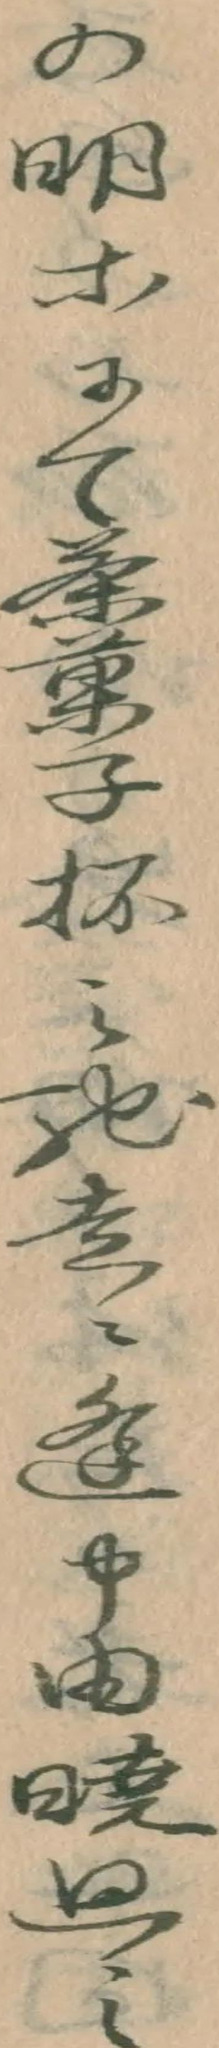の明等尓て茶菓子抔之馳走に逢申由暁廻之
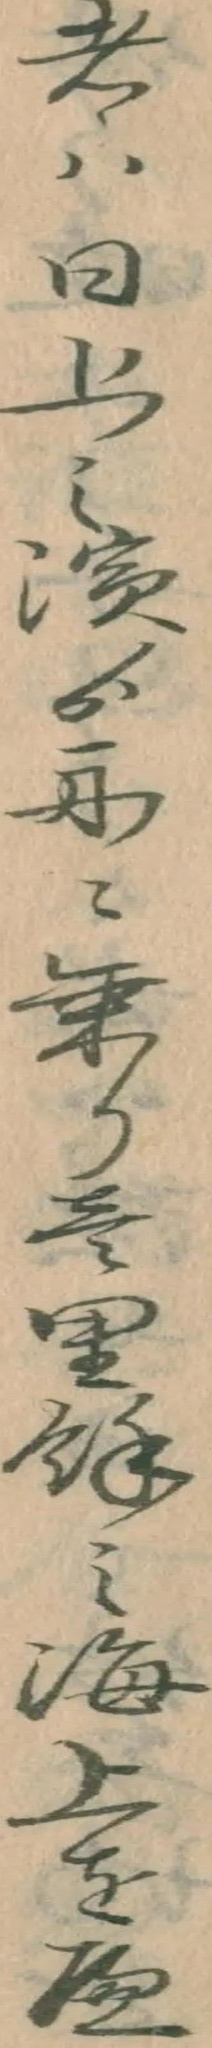者は日上之浜ゟ舟に乗り壱里余之海上を扁
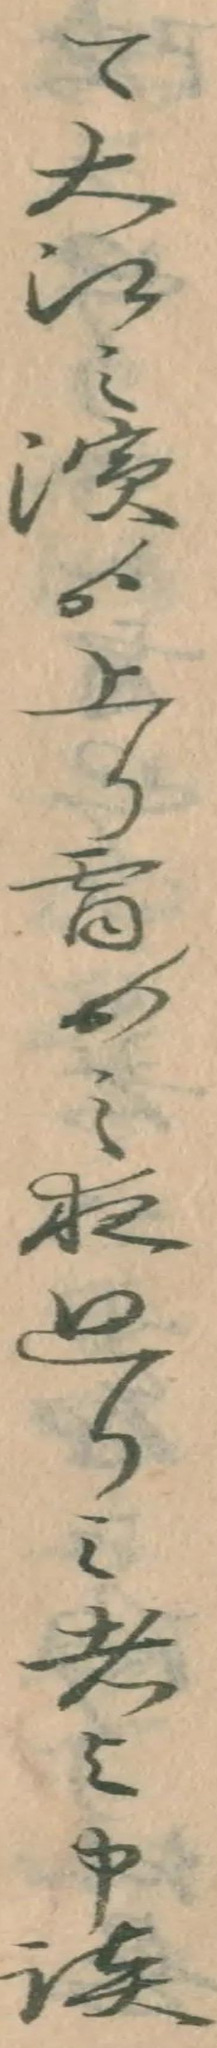て大江之浜ゟ上り宵ゟ之夜廻り之者与申談

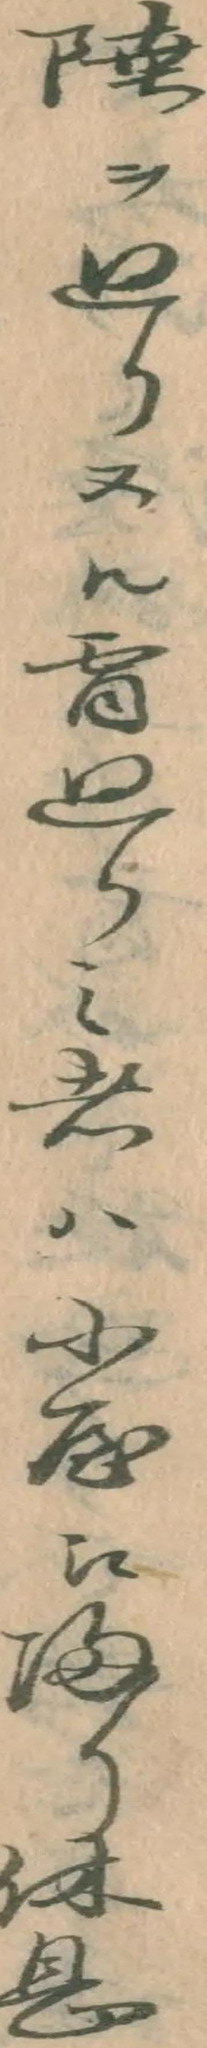陸を廻りぬる宵廻り之者は小屋江帰り休息
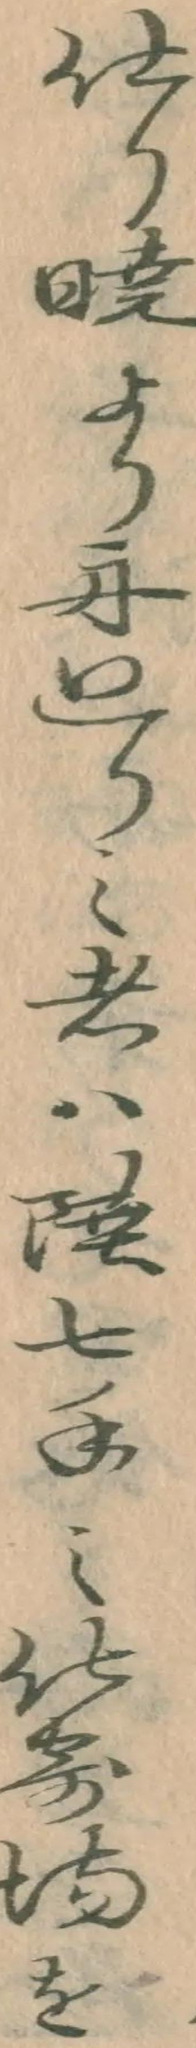仕り暁より舟廻り之者は陸七手之仕寄場を
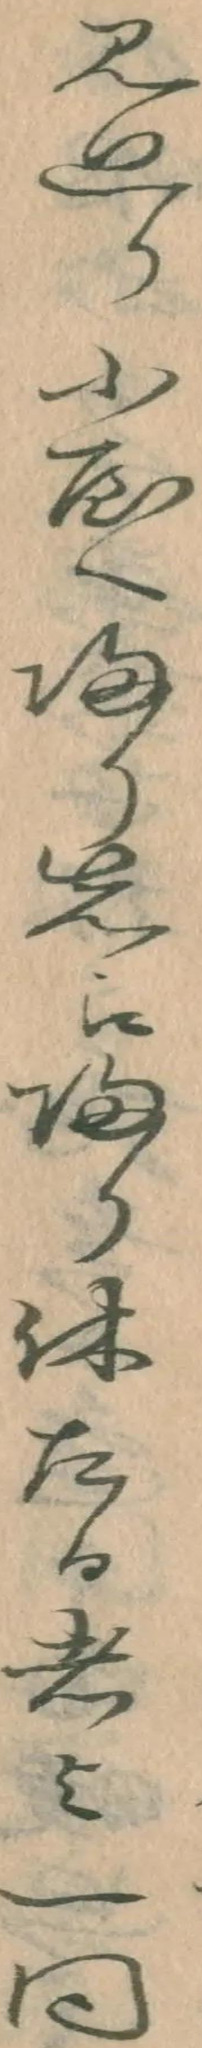見廻り小屋へ帰り先江帰り休たる者与一同
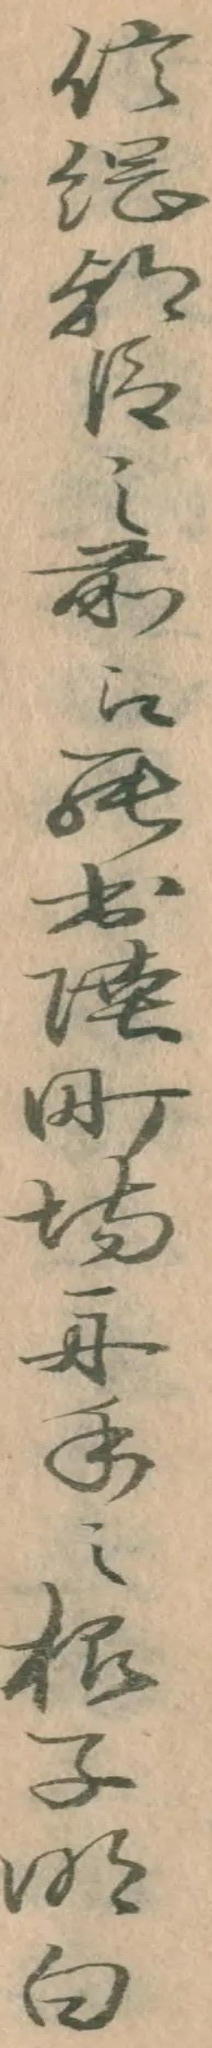信綱朝臣之前江罷出陸町場舟手之様子明白
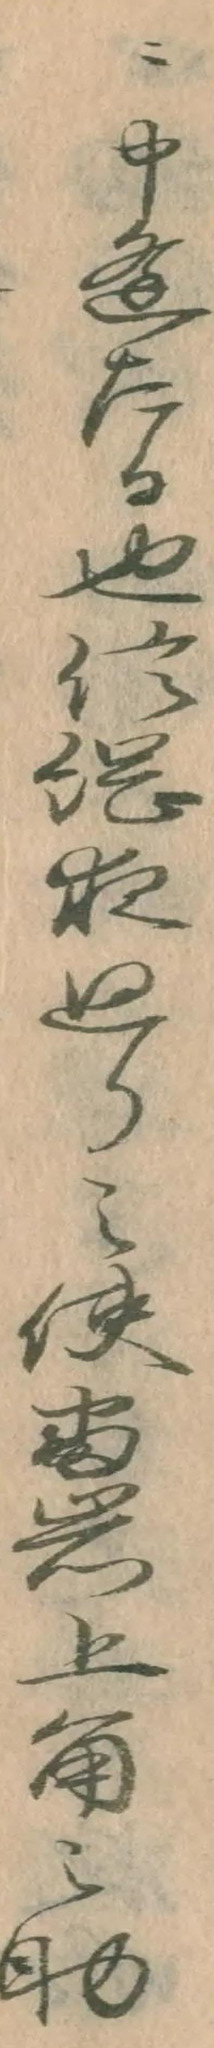に申逢たる也信綱夜廻り之使番岩上角之助
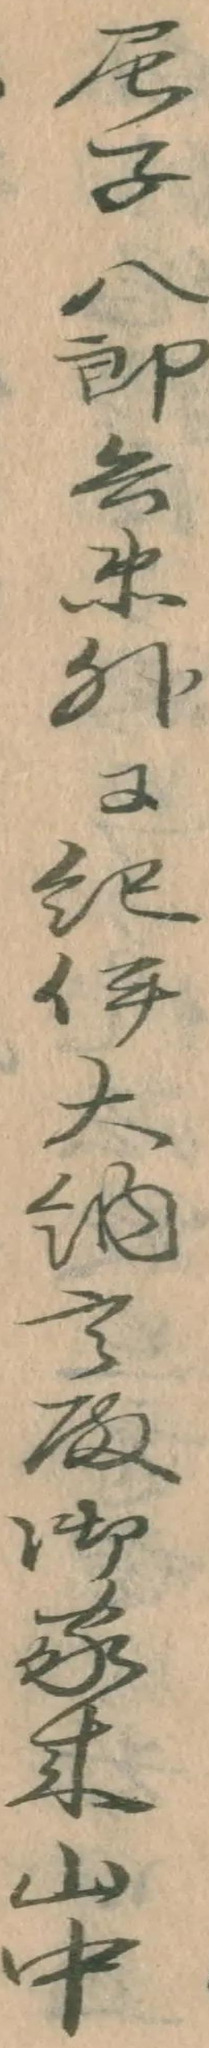尼子八郎兵衛外尓紀伊大納言殿御家来山中
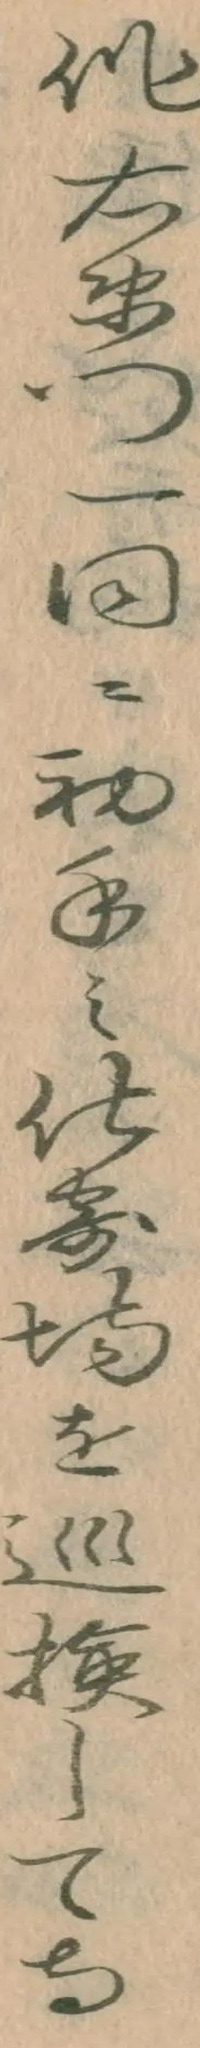作右衛門一同に初手之仕寄場を巡検して寺
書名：切支丹御退治記 49巻. [7]
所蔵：国立国会図書館 National Diet Library, JAPAN
